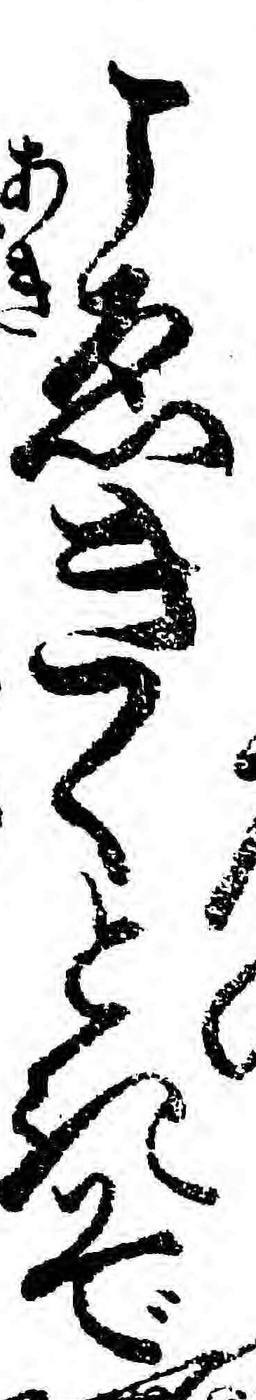こゑきくときぞ
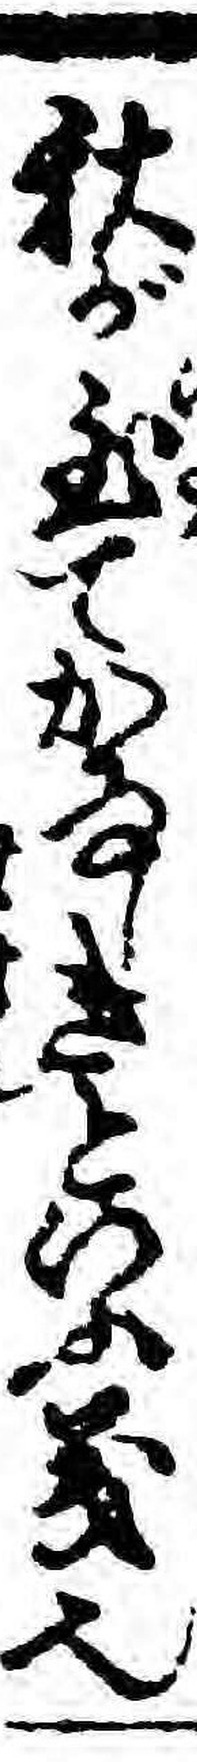秋が至てかなしきといふ義也
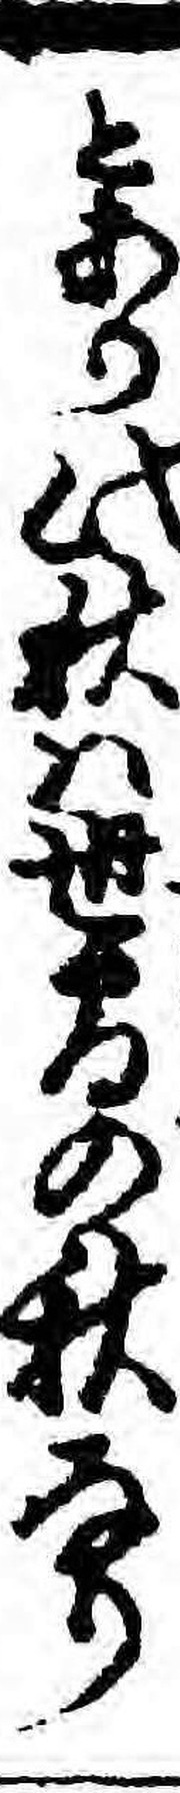とあり此秋は世間の秋なり
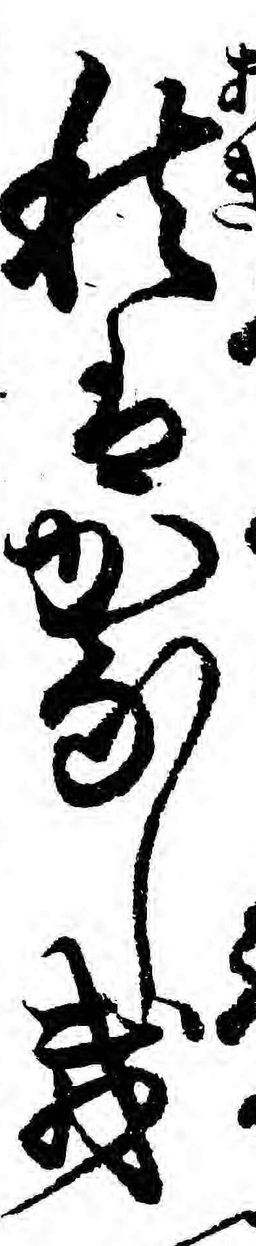秋はかなしき

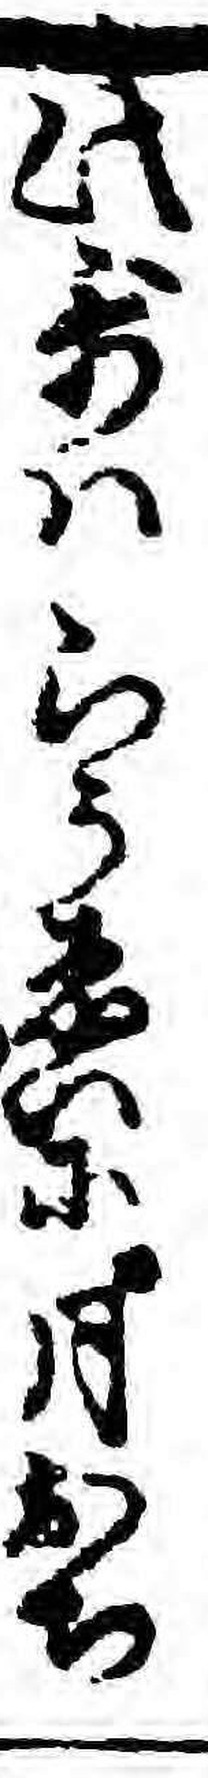此哥はらうゑいに月おち
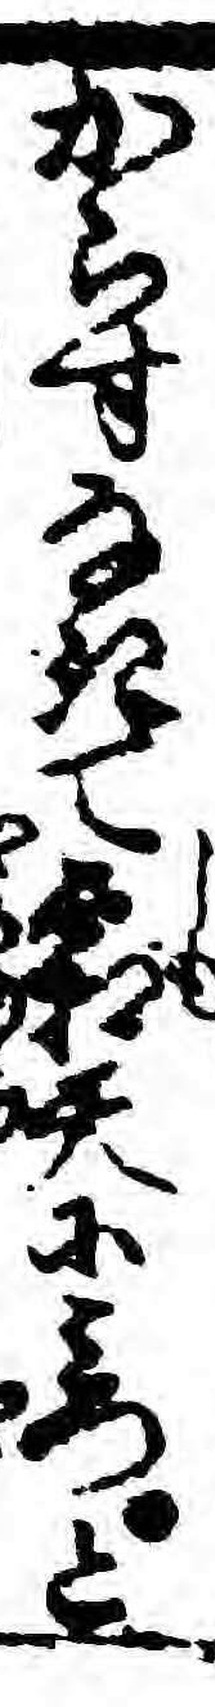からすなきて霜天にみつと
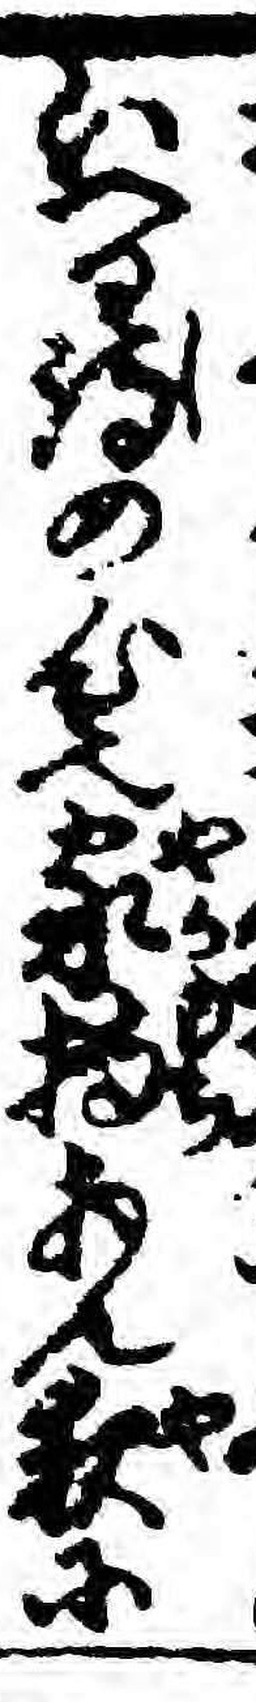いへる詩の心也家持あん夜に
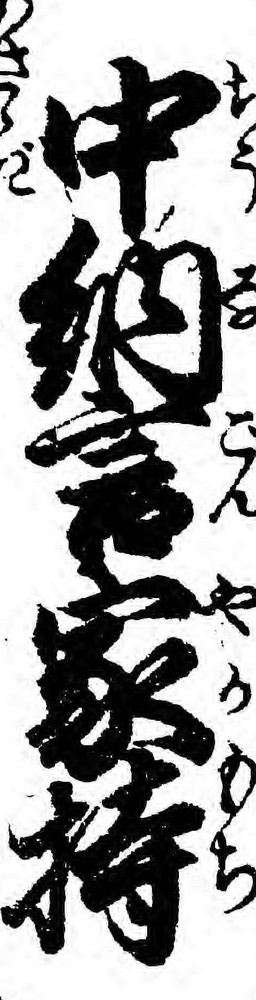中納言家持
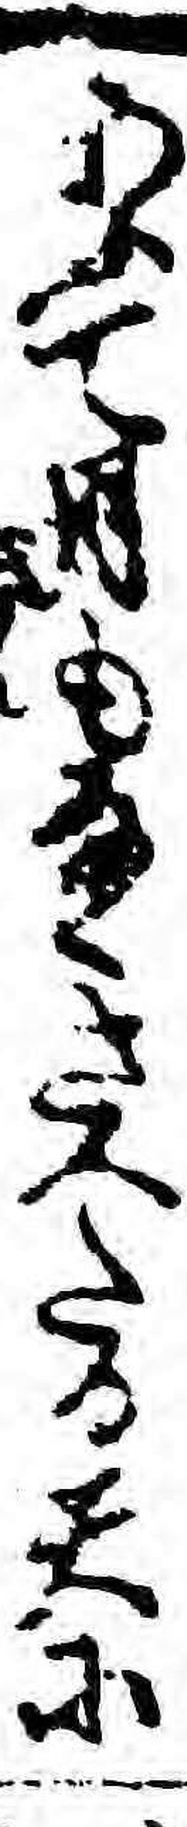あふて月もなくさへたる天に
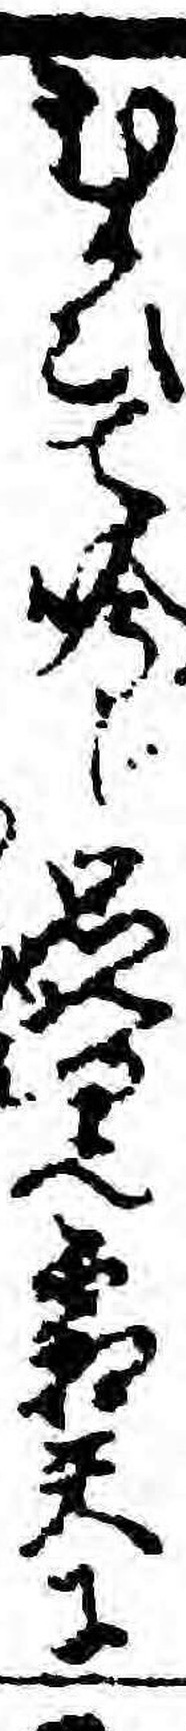むかひて吟じ思へる也霜天に
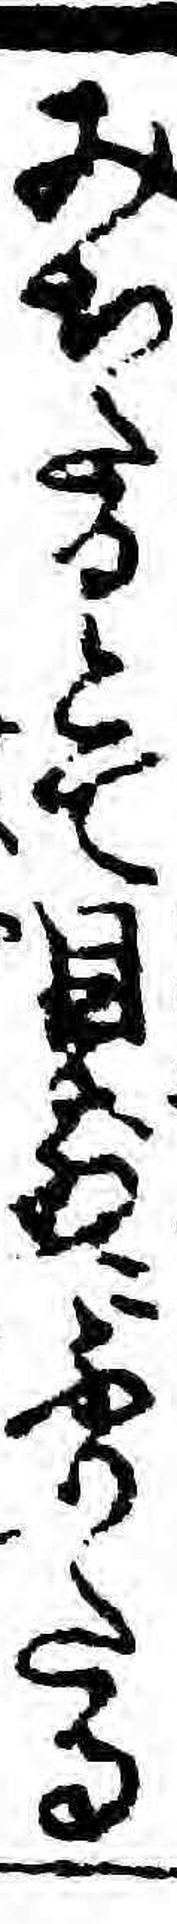みちたるとて目前にふりたる
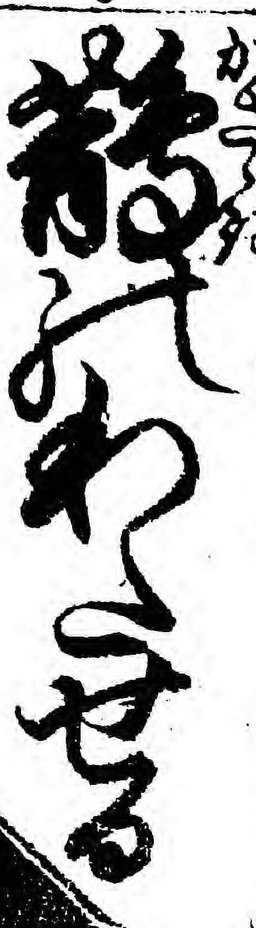鵲のわたせる
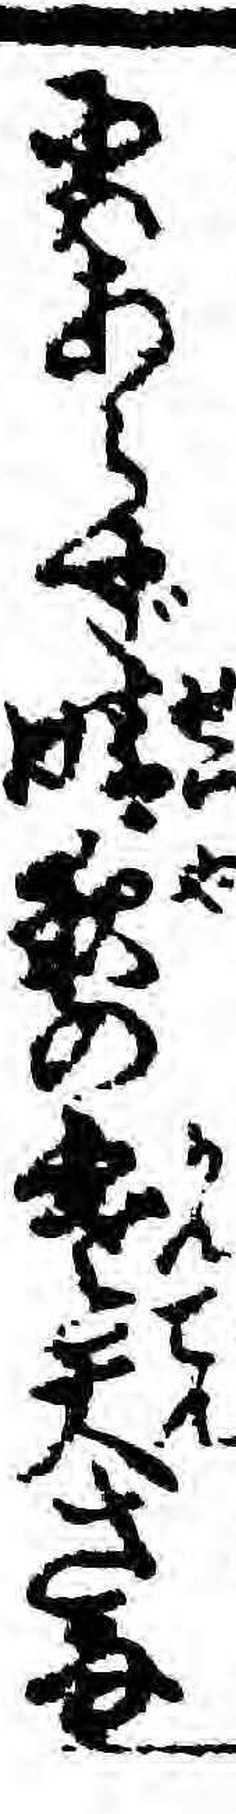にはあらず晴夜の寒天さな
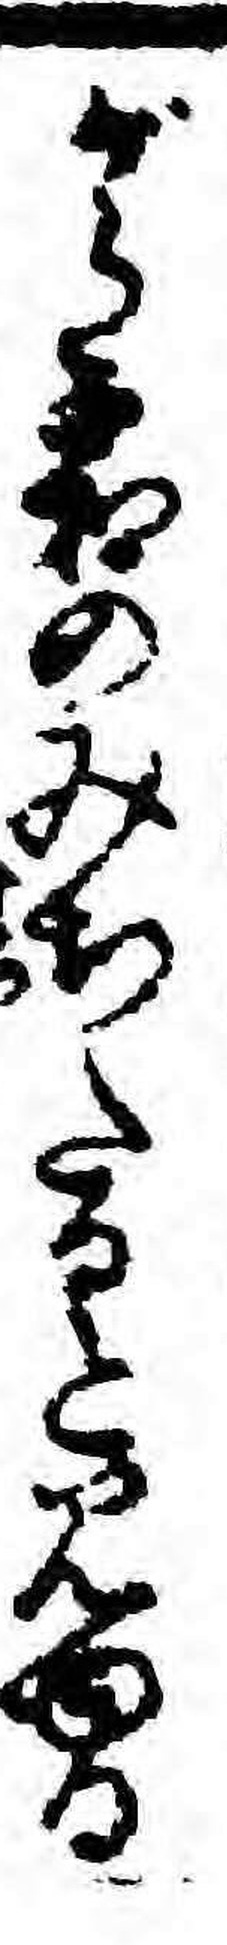がら霜のみちたると見ゆる
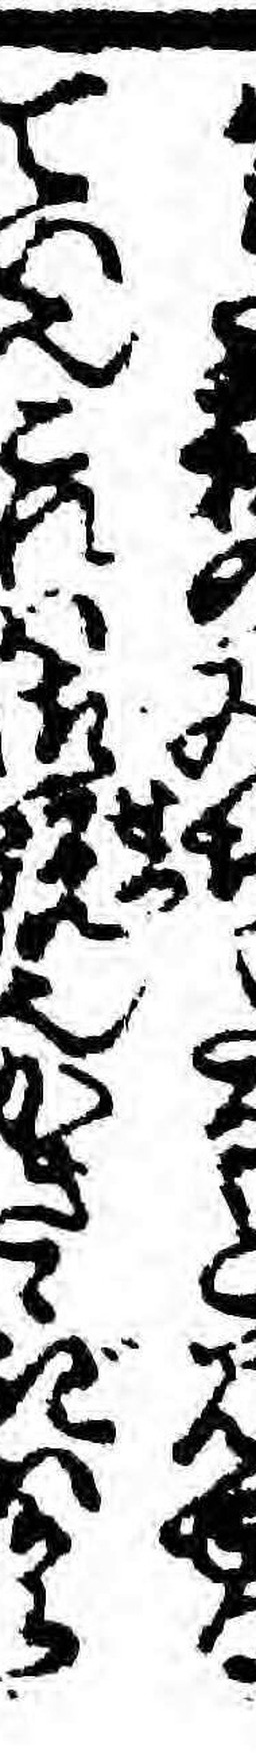てい也これは御説也かさゝぎはから
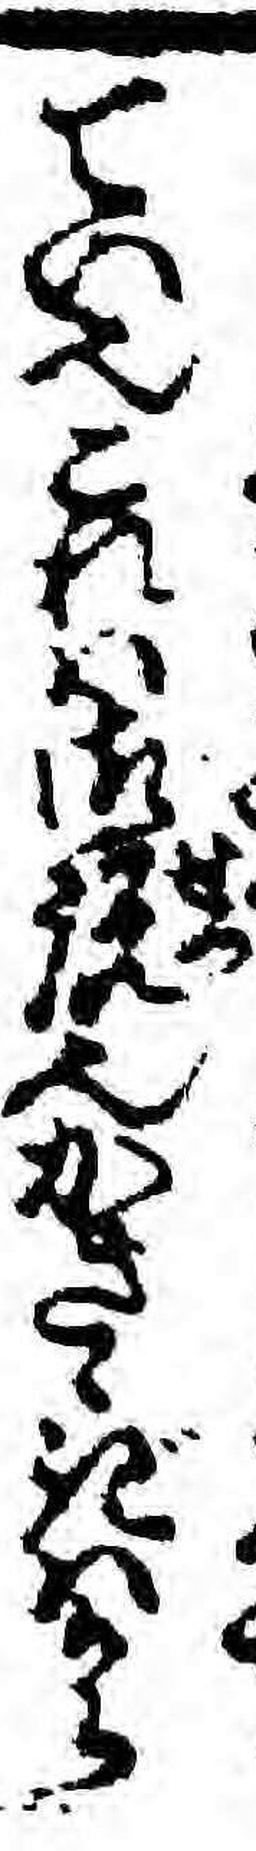てい也これは御説也かさゝぎはから
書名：頭書和歌注譯／壽賀多百人一首小倉錦
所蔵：国文学研究資料館
